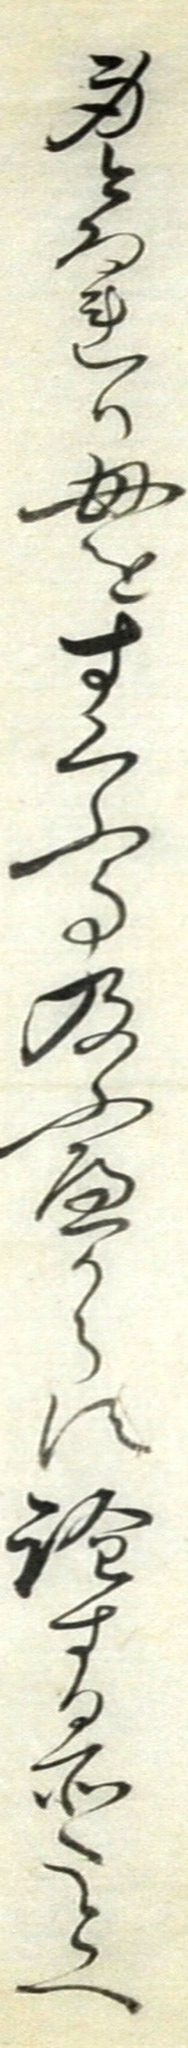身となれり母をすくふ事及ふへからす詮する所たとへ
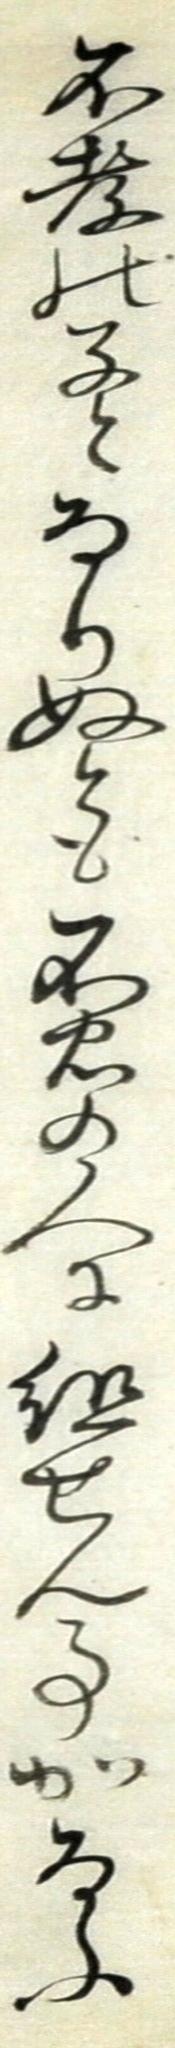不孝の子となりぬとも不忠の人に組せん事かなふ
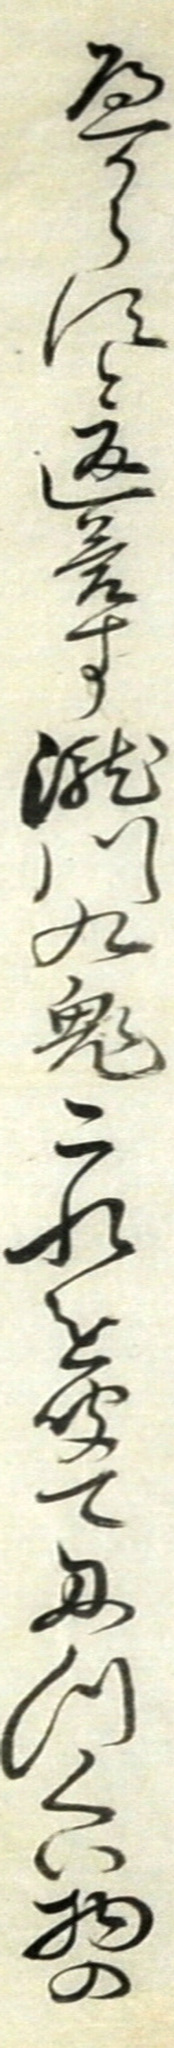へからすと返答す滝川九鬼これを聞てにつくい物の
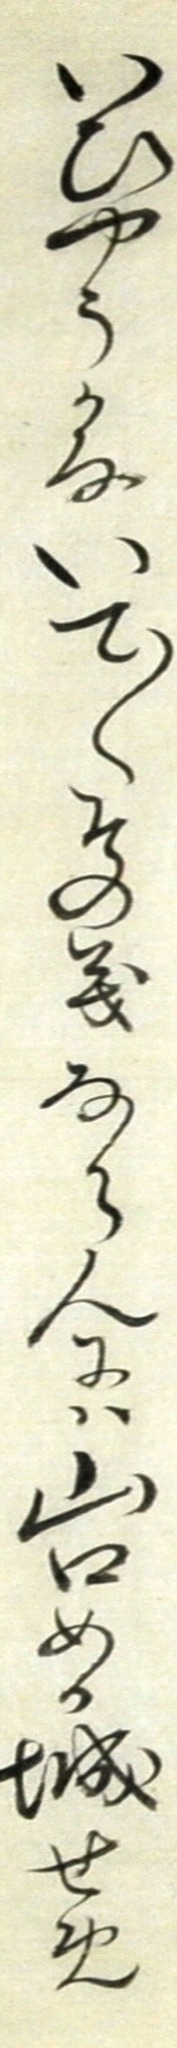いひやうかないて〳〵その義ならんには山口めか城せめ
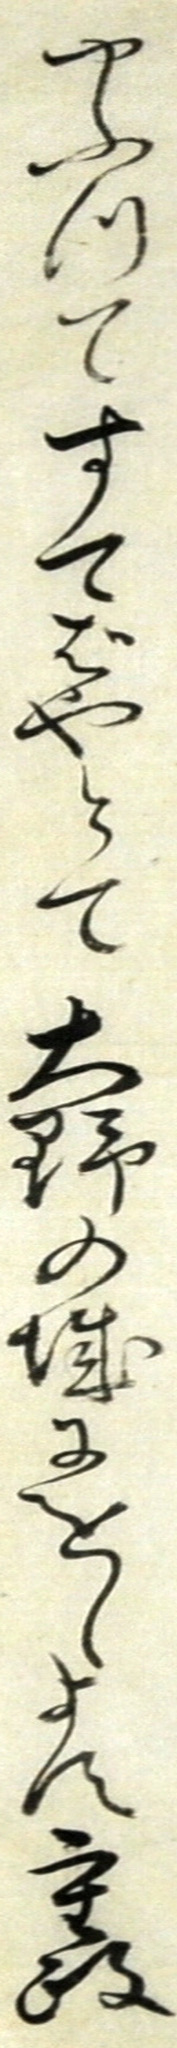やふつてすてばやとて大野の城にをしよす重政
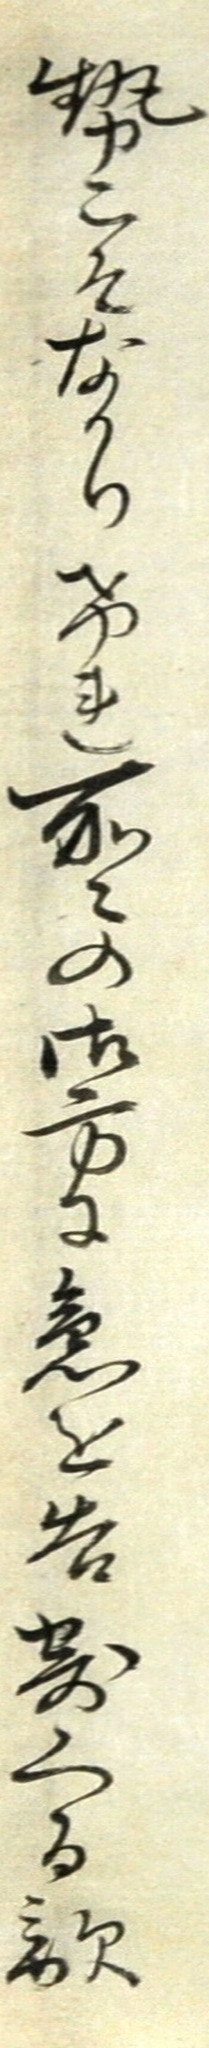勢こそなかりけれ所々の御方に急を告寄くる敵

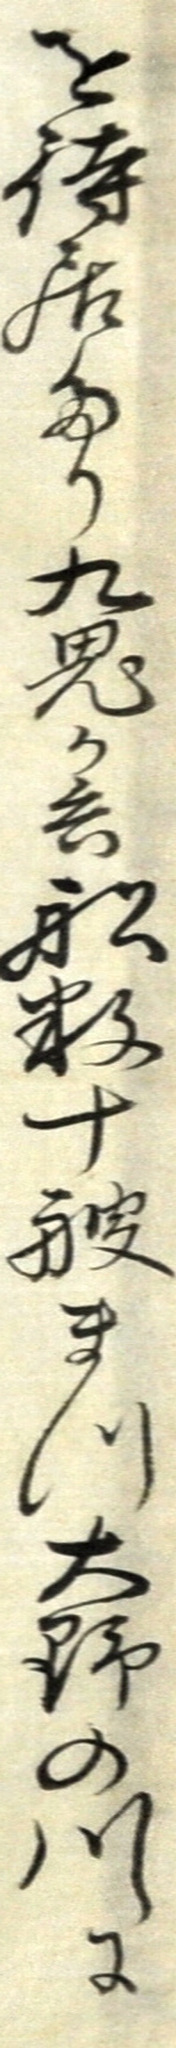を待居たり九鬼か兵船数十艘まつ大野の川に
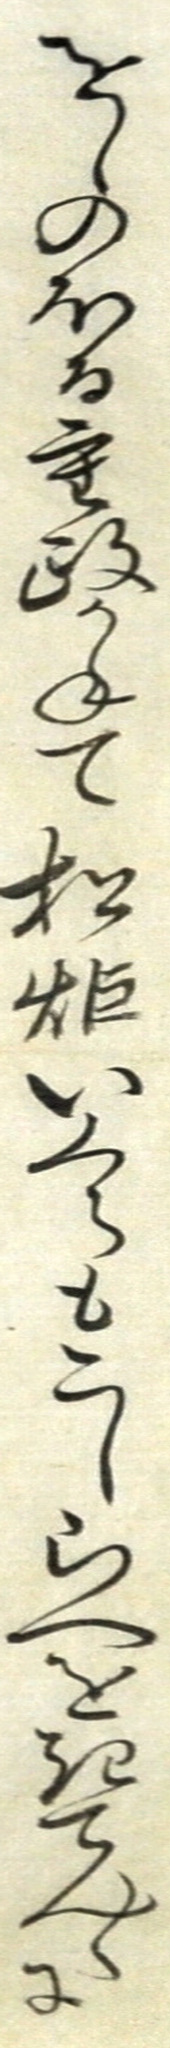をしのほる重政かねて松炬いくらもこしらへをきてん〳〵に
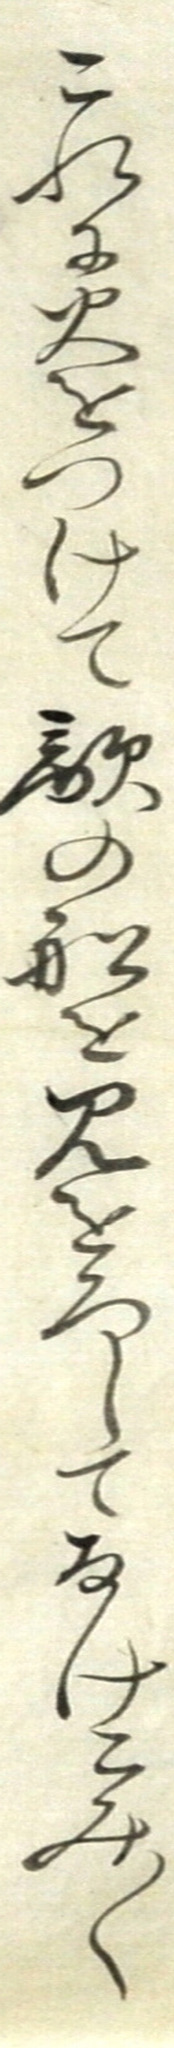これに火をつけて敵の船を見をろしてなけこみ〳〵
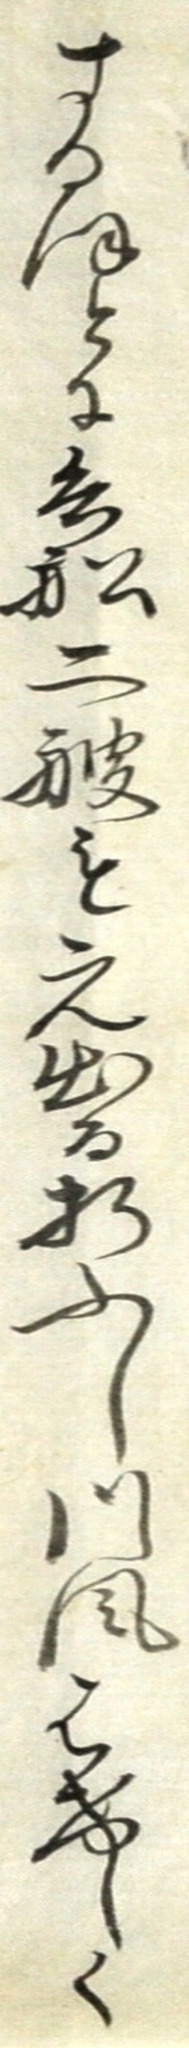するほとに兵船二艘もえ出る折ふし川風はけしく
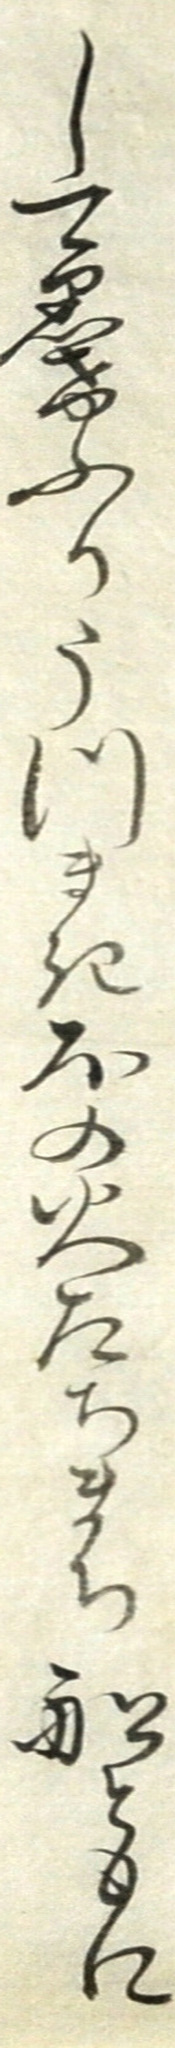して黒けふりうつまきほの火たちまち船ともに
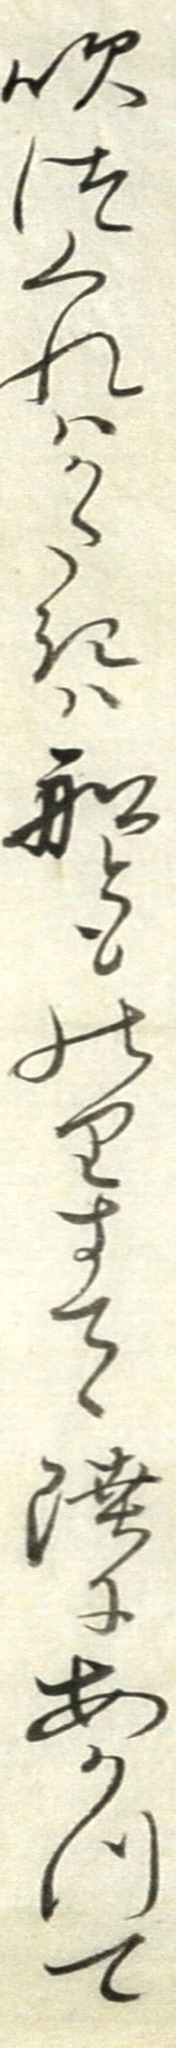吹つくれはかたきは船とものりすてゝ陸にあかつて
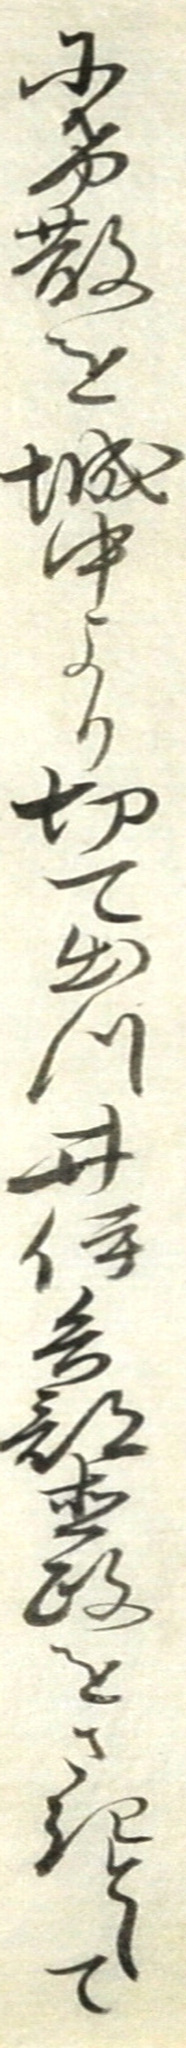にけ散を城中より切て出つ井伊兵部直政をさきとして
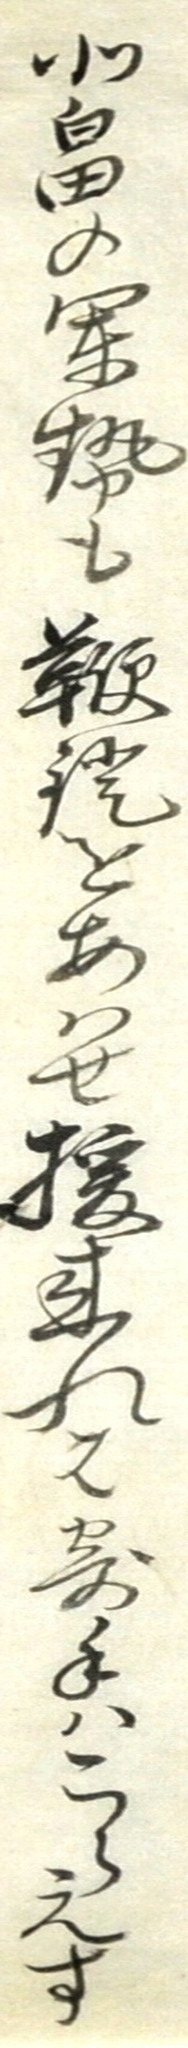北畠の軍勢も鞭鐙をあはせ援来れは寄手はこらえす
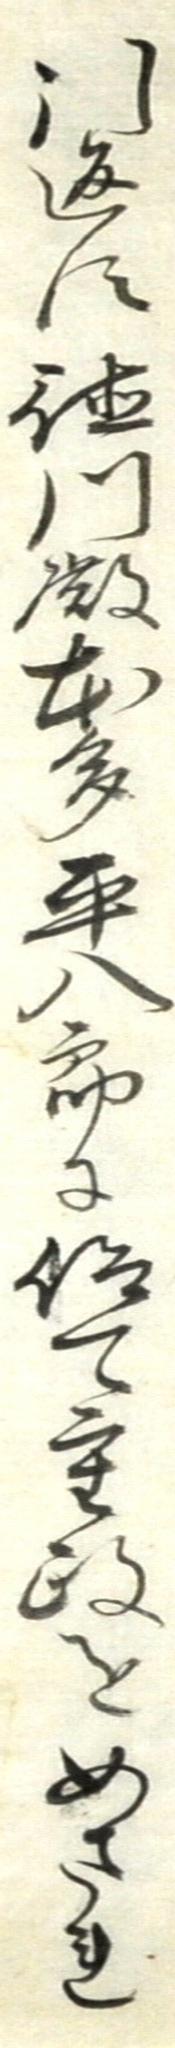引返す徳川殿本多平八郎に仰て重政をめされ
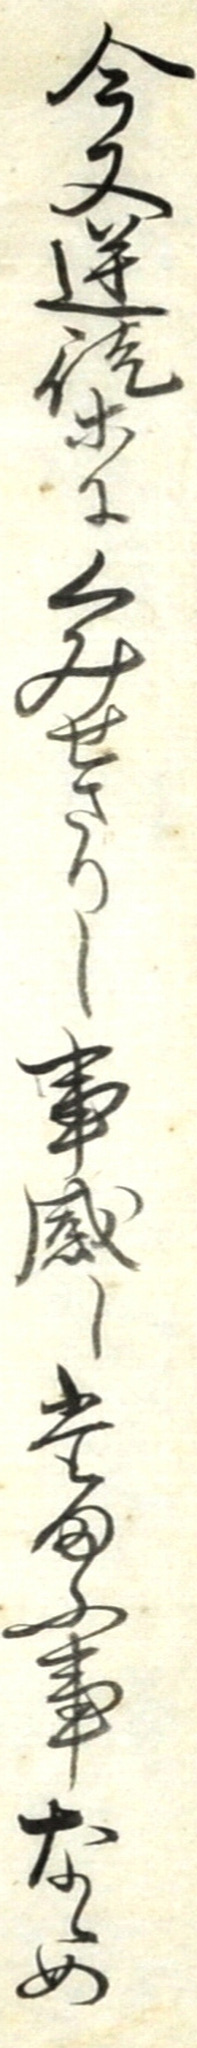今又逆徒等にくみせさりし事感したまふ事なゝめ
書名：藩翰譜（六）
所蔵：伊那市立高遠町図書館・合同会社AMANE
